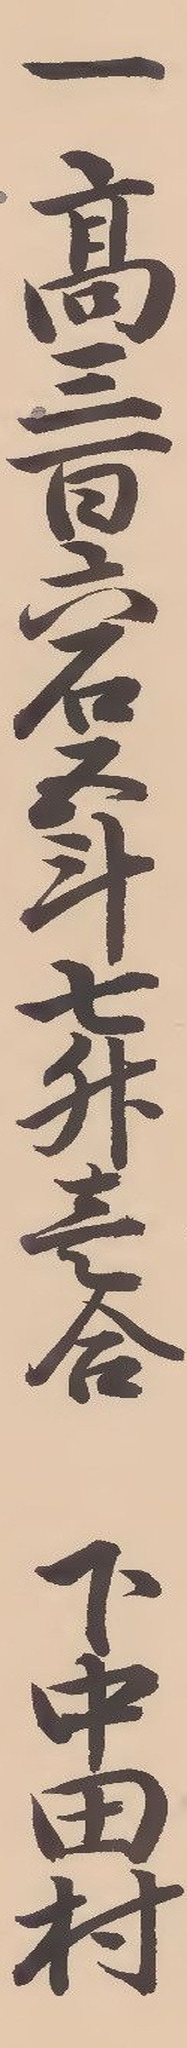一高三百六石五斗七升壱合下中田村
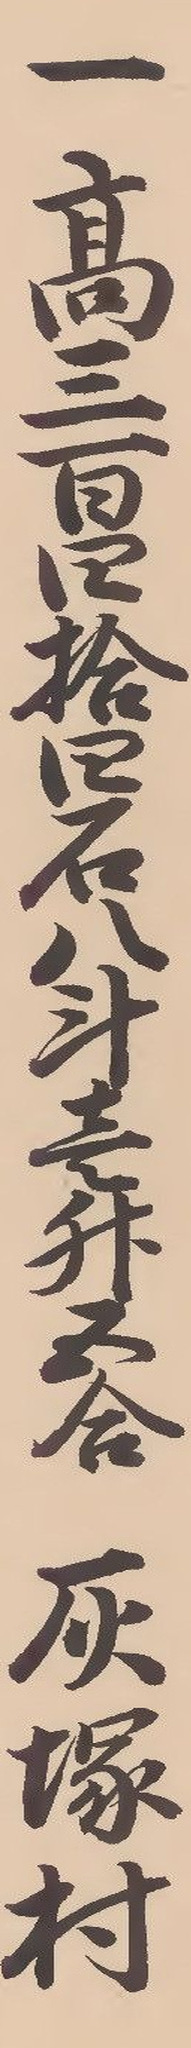一高三百四拾四石八斗壱升五合灰塚村
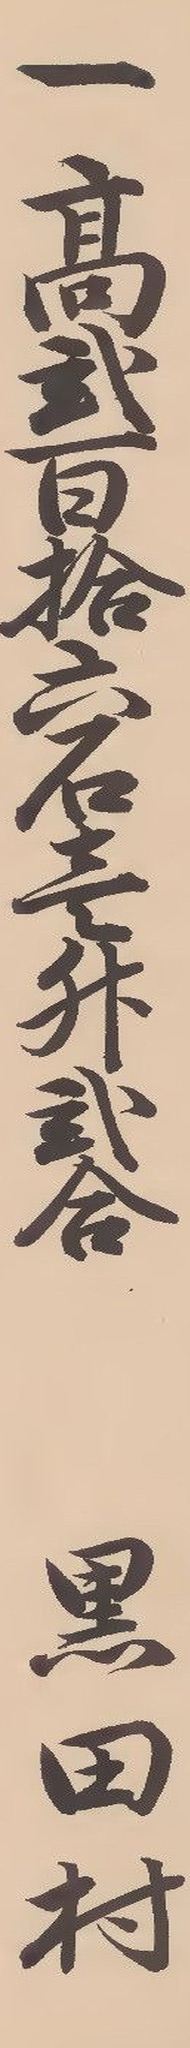一高弐百拾六石壱升弐合黒田村
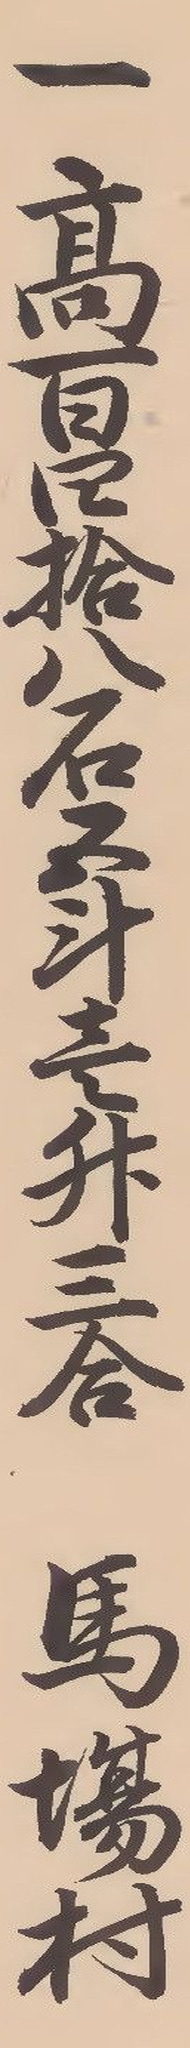一高百四拾八石五斗壱升三合馬場村
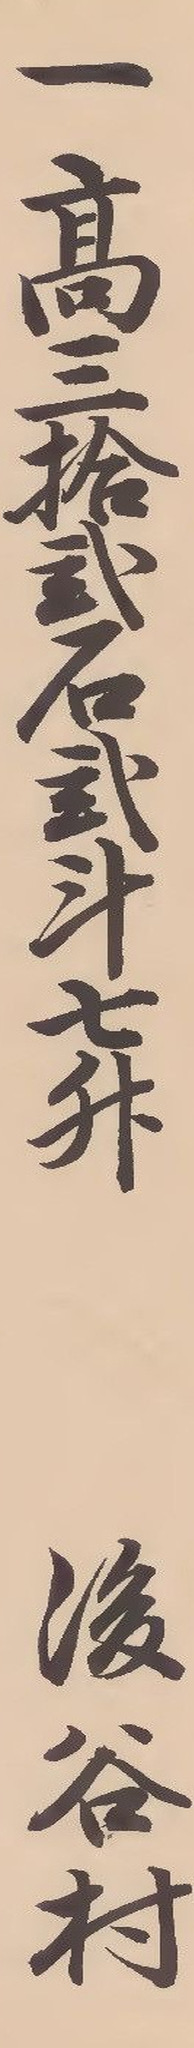一高三拾弐石弐斗七升後谷村
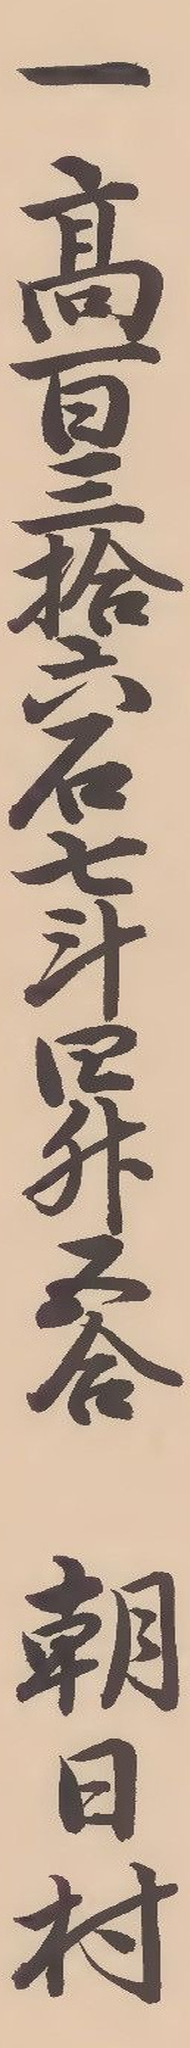一高百三拾六石七斗四升五合朝日村

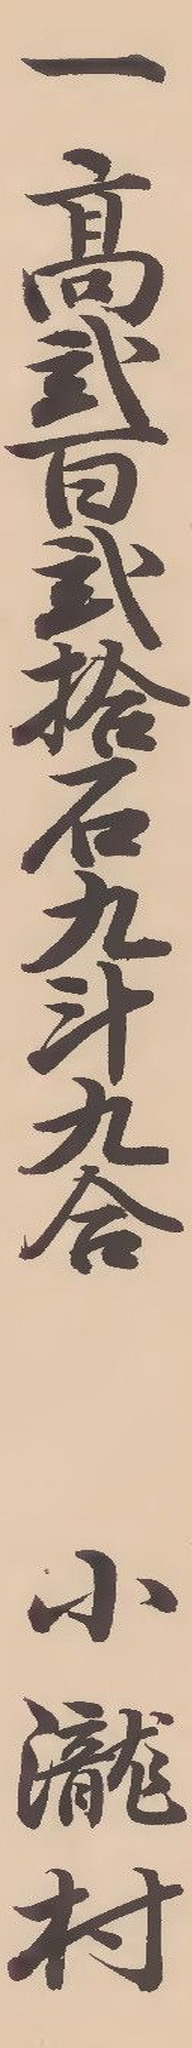一高弐百弐拾石九斗九合小滝村
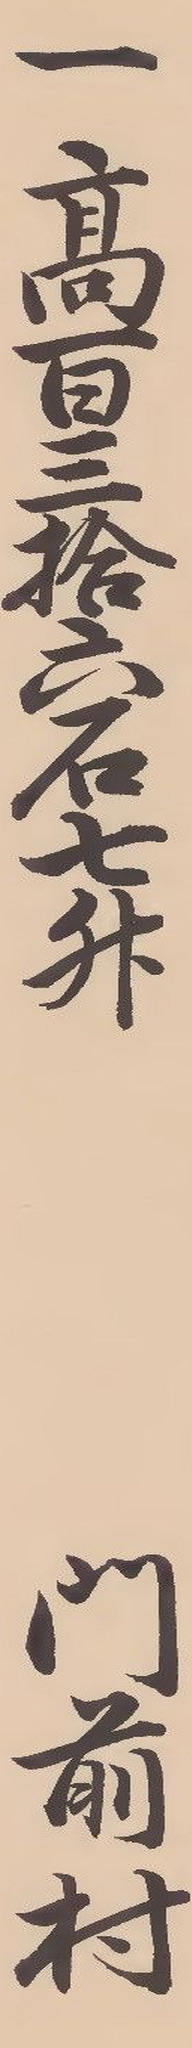一高百三拾六石七升門前村
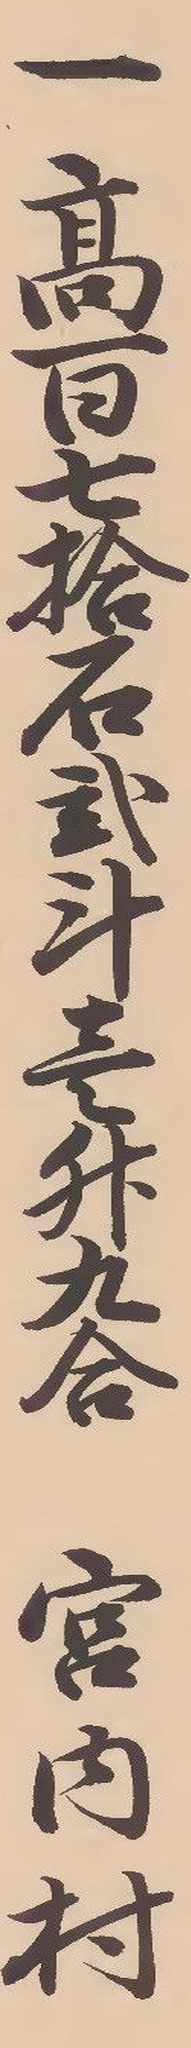一高百七拾石弐斗壱升九合宮内村
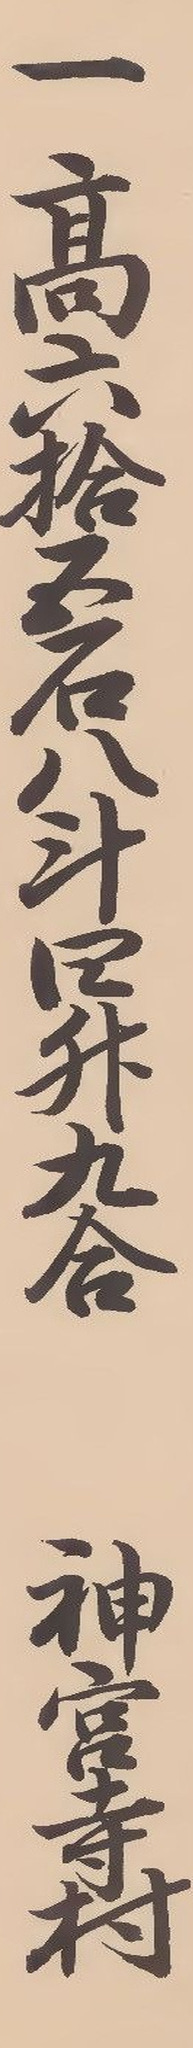一高六拾五石八斗四升九合神宮寺村
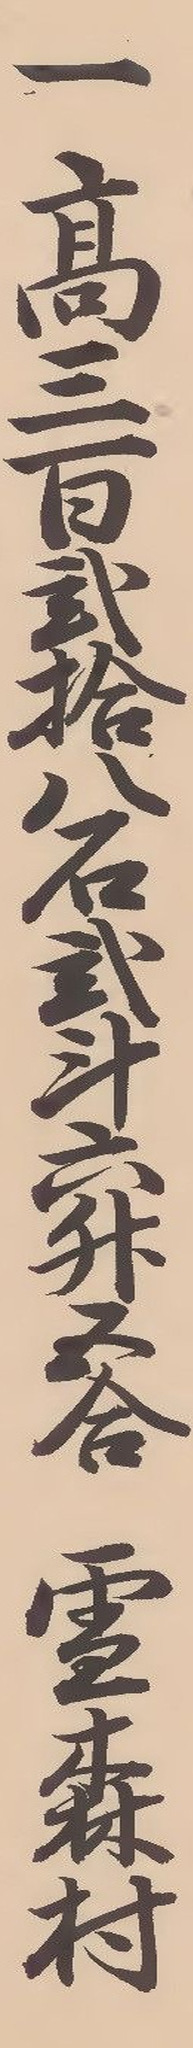一高三百弐拾八石弐斗六升五合雪森村
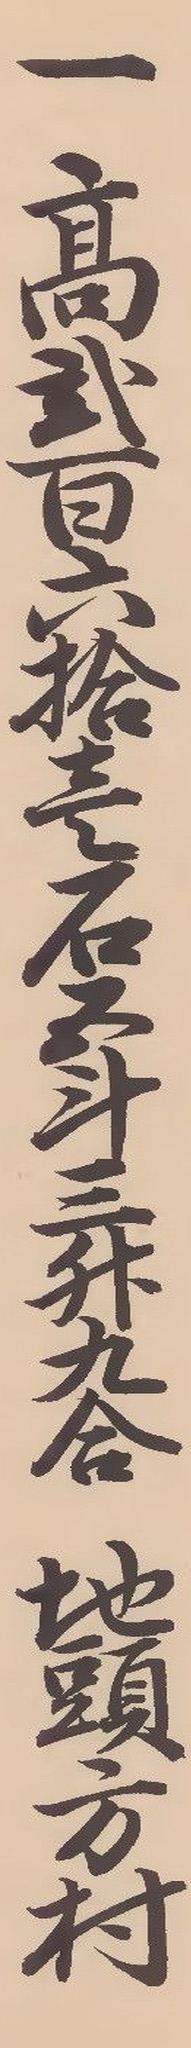一高弐百六拾壱石五斗三升九合地頭方村
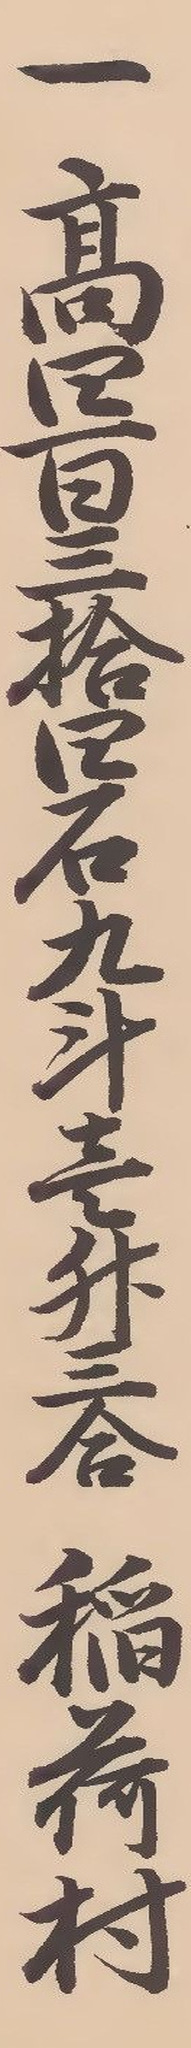一高四百三拾四石九斗壱升三合稲荷村

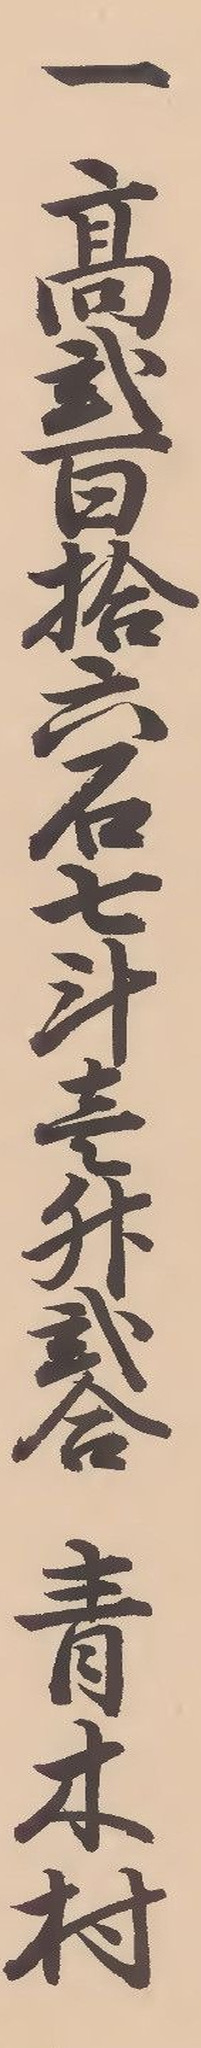一高弐百拾六石七斗壱升弐合青木村
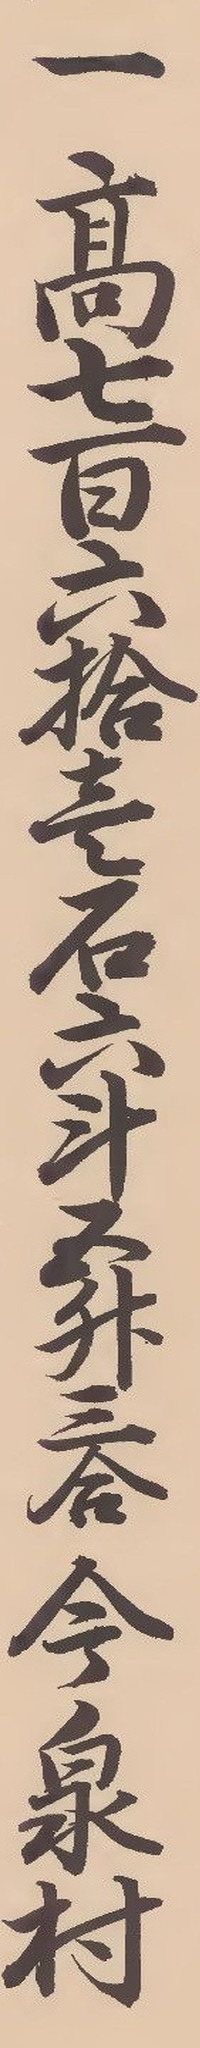一高七百六拾壱石六斗五升三合今泉村
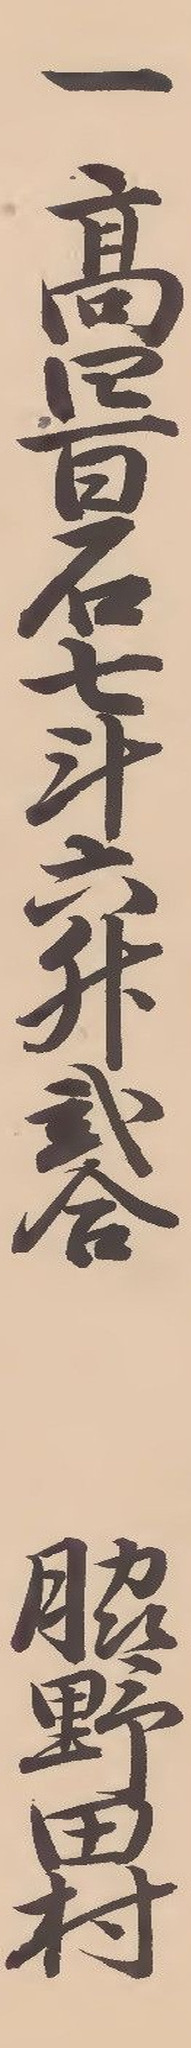一高四百石七斗六升弐合脇野田村
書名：越後国郷帳　上
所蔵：国立公文書館 National Archives of Japan
